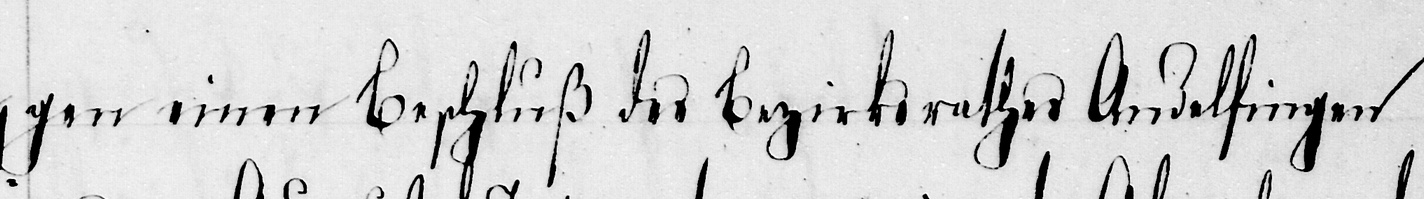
gen einen Beschluß des Bezirksrathes Andelfingen
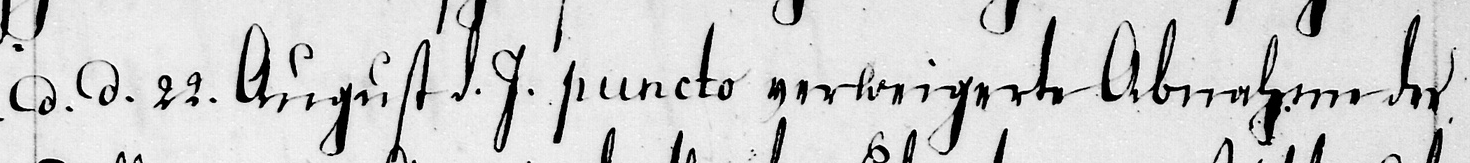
d. d. 22. August d. J. puncto verweigerte Abnahme der
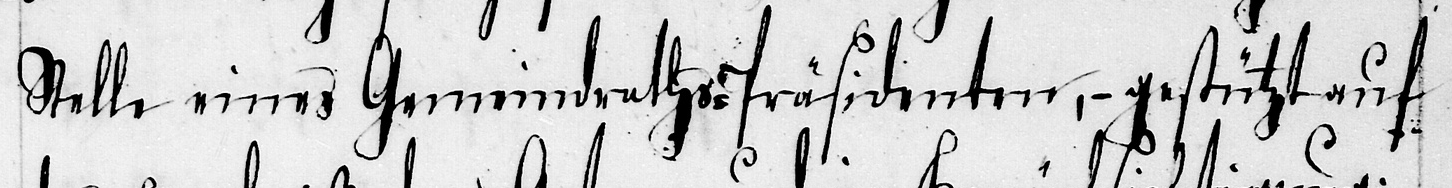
Stelle eines Gemeindraths-Präsidenten, – gestützt auf
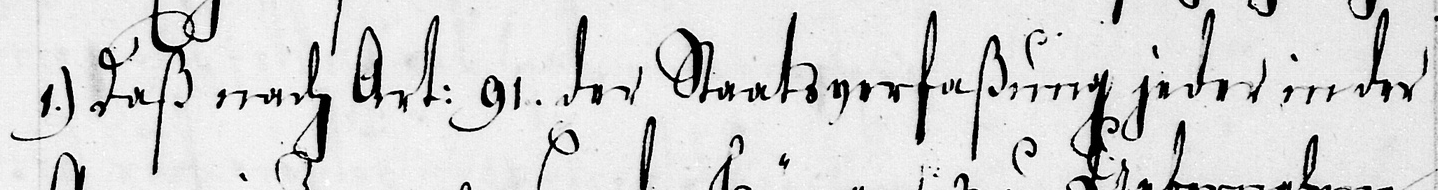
1.) Daß nach Art: 91. der Staatsverfaßung jeder in der
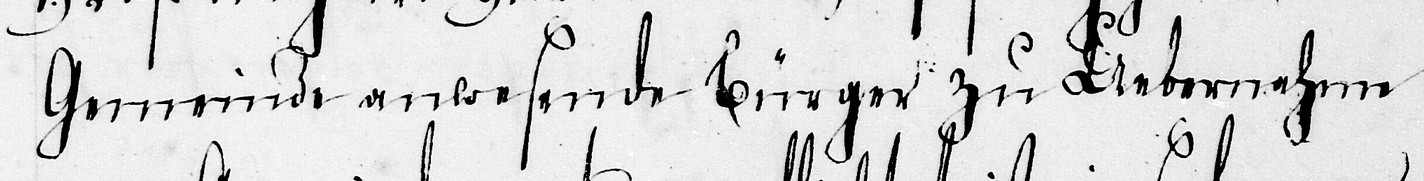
Gemeinde anwesende Bürger zu Uebernahme
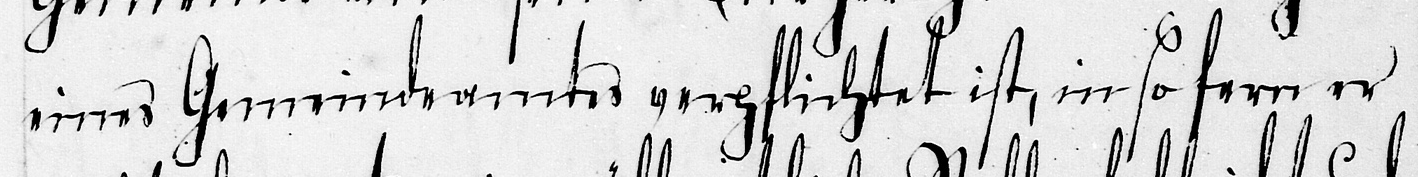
eines Gemeindeamtes verpflichtet ist, in so fern er
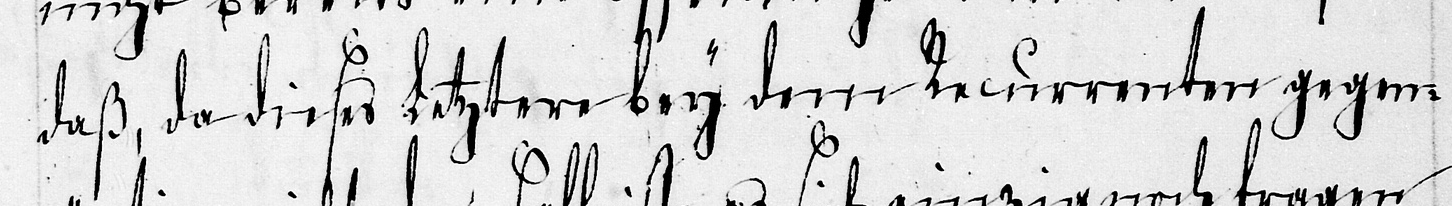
daß, da dieses Letztere bey dem Recurrenten gegen¬
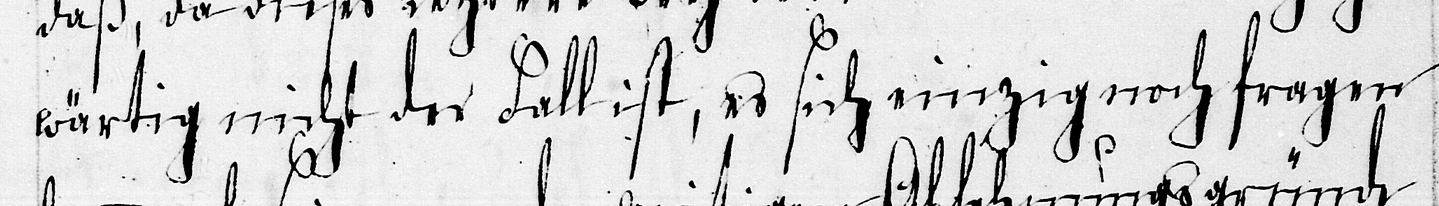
wärtig nicht der Fall ist, es sich einzig noch fragen
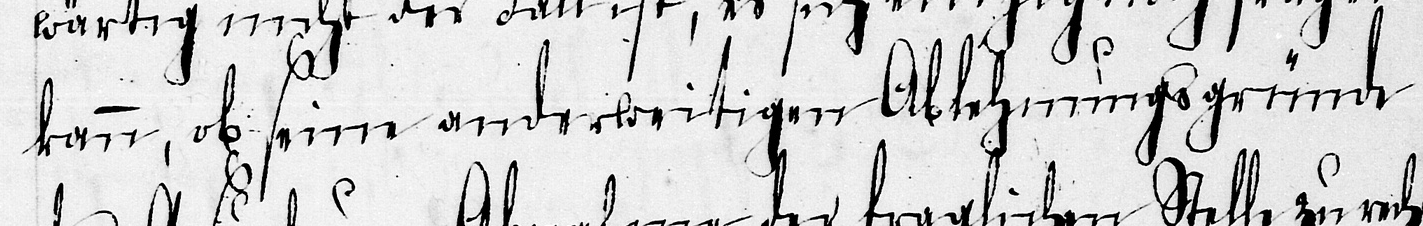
kann, ob seine anderweitigen Ablehnungsgründe
